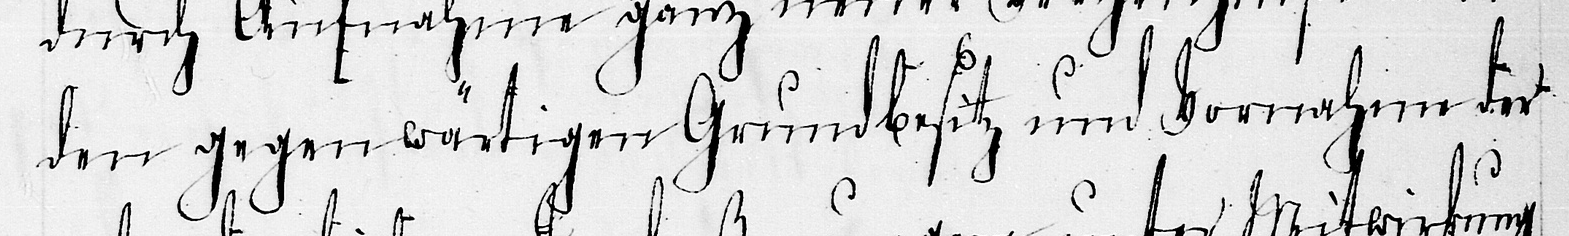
den gegenwärtigen Grundbesitz und Vornahme der
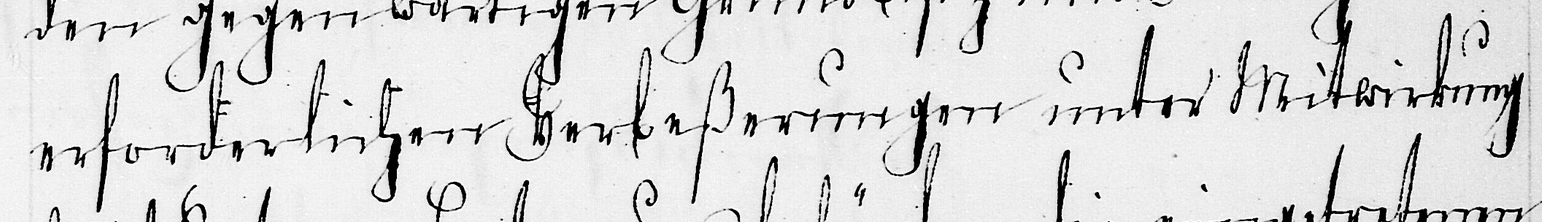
erforderlichen Verfaßungen unter Mitwirkung
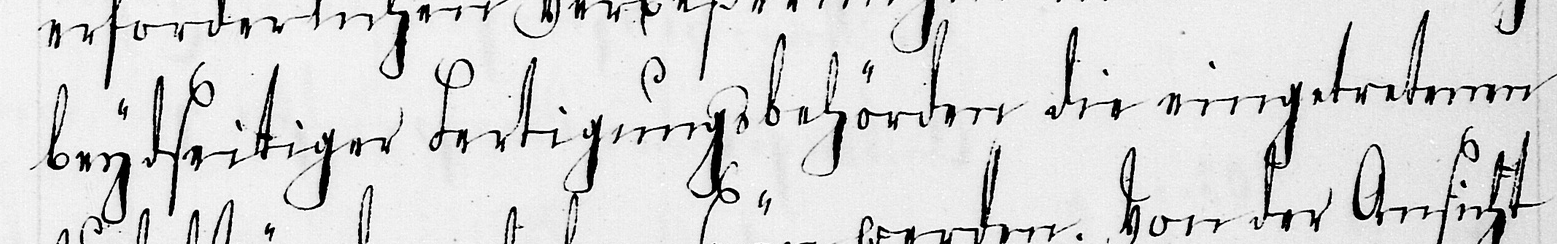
beydseitiger Fertigungsbehörden die eingetretenen
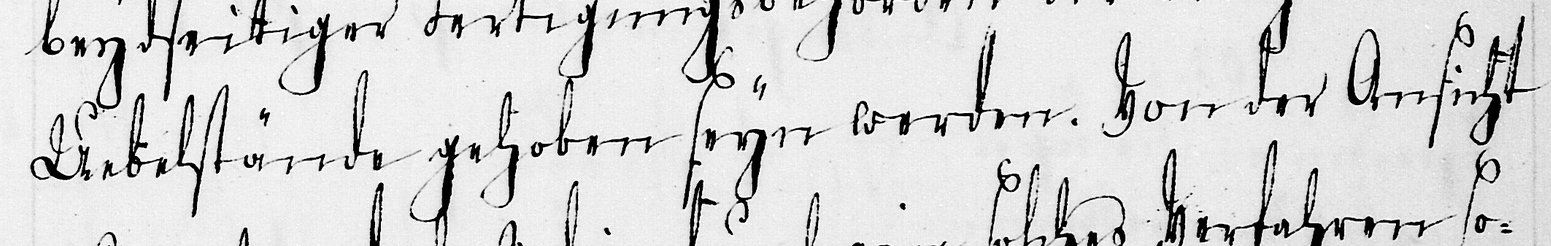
Uebelstände gehoben seyn werden. Von der Ansicht
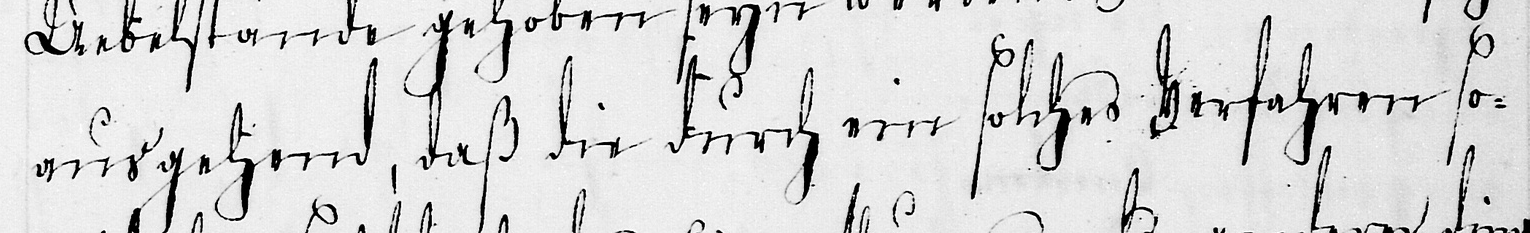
ausgehend, daß die durch ein solches Verfahren so¬
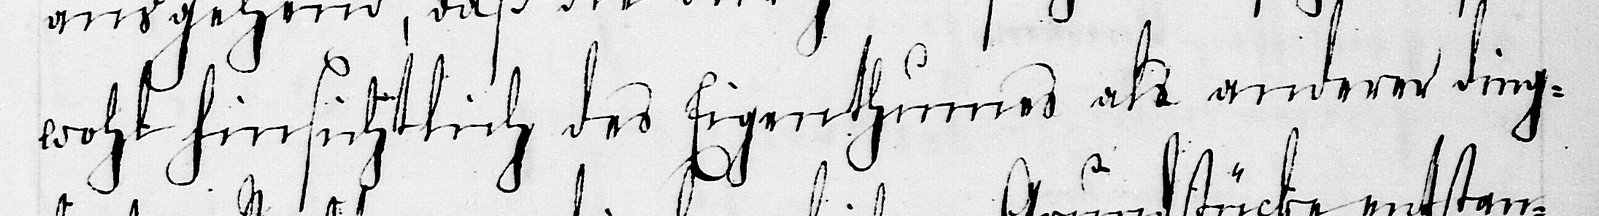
wohl hinsichtlich des Eigenthumes als anderer ding¬
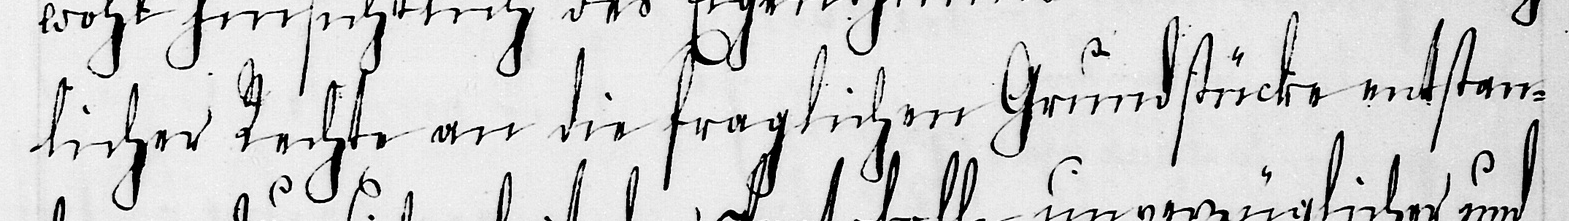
licher Rechte an die fraglichen Grundstücke entstan¬
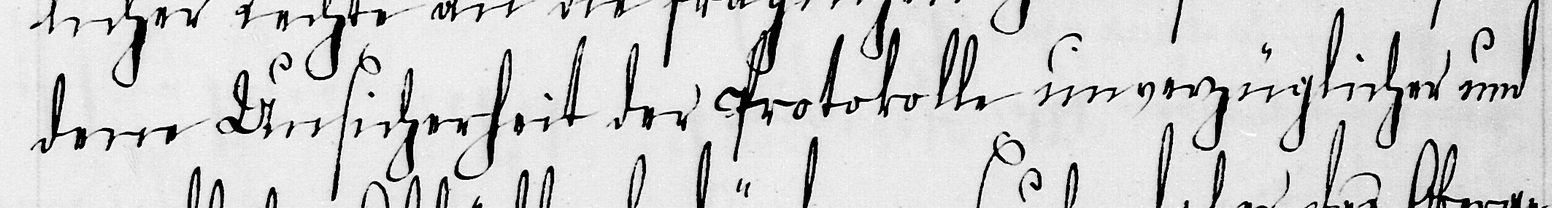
dene Unsicherheit der Protokolle unverzüglicher und
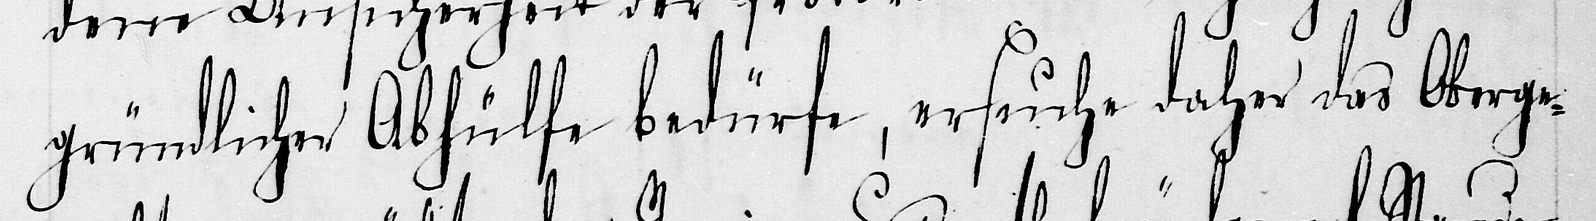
gründlicher Abhülfe bedürfe, ersuche daher das Oberge¬
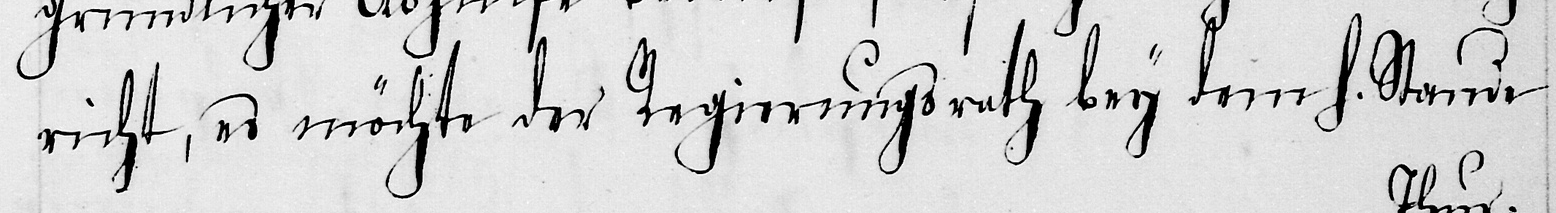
richt, es möchte der Regierungsrath bey dem h. Stande
